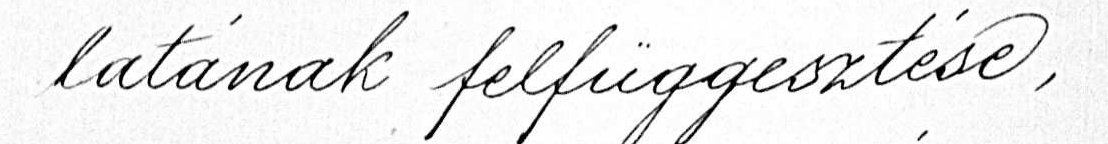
latának felfüggesztése,
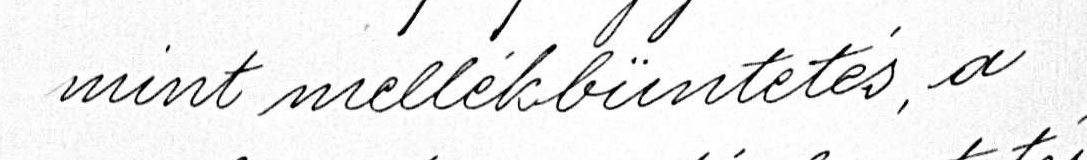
mint mellékbüntetés, a
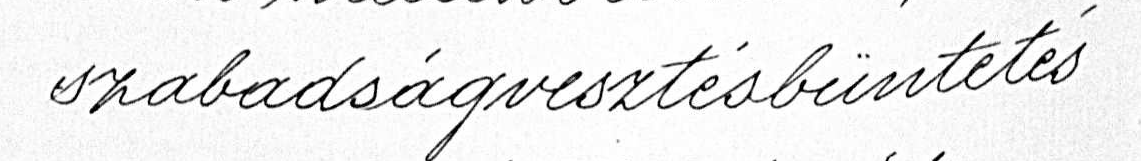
szabadságvesztésbüntetés
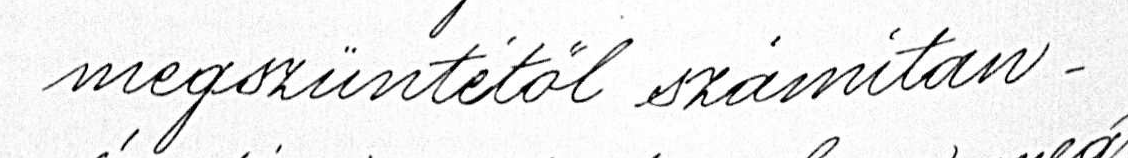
megszüntétöl számitan¬
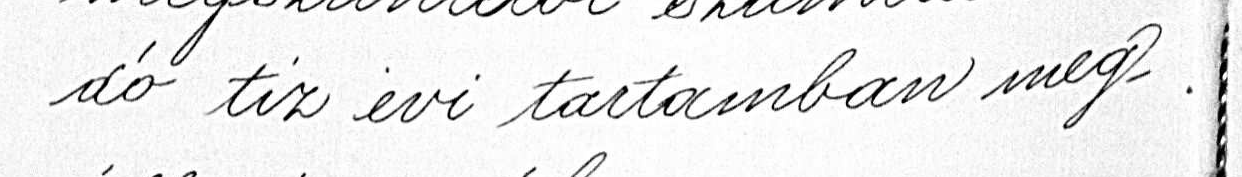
dó tiz évi tartamban meg¬
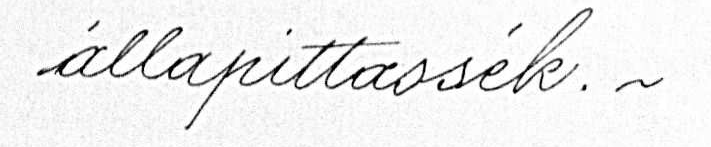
állapittassék.~
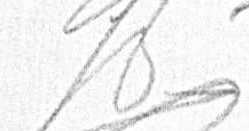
xx
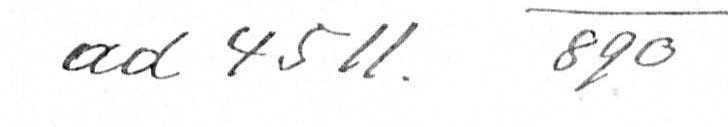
ad 4511. 890
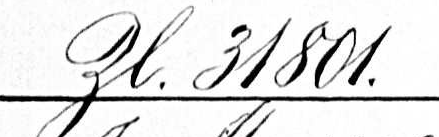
Zl. 31801.
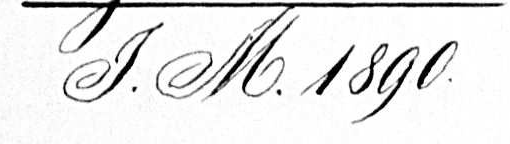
J. M. 1890
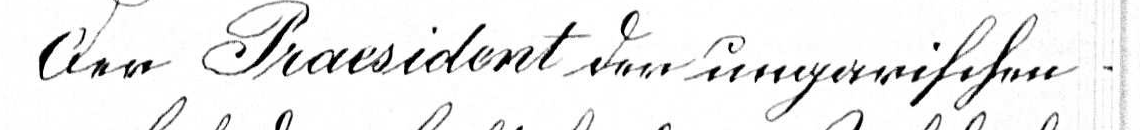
Der Praesident der ungarischen
